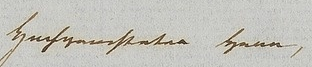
Hochgeachteter Herr,
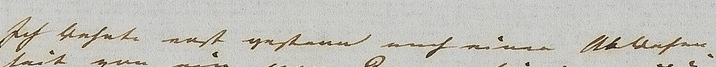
Ich kehrte erst gestern nach einer Abwesen-
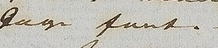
Tage fort. –
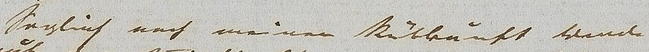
Sogleich nach meiner Rükkunft werde
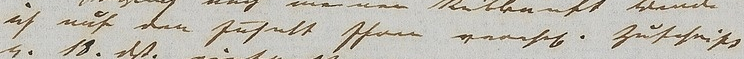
ich auf den Innhalt Ihrer verehrl. Zuschrift
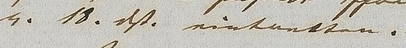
v. 18. dß. eintretten. –
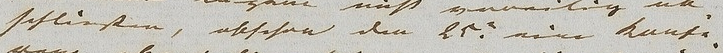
schließen, obschon den 25n eine Konfer-
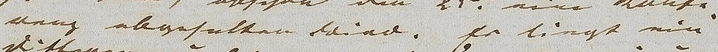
renz abgehalten wird. Es liegt ein
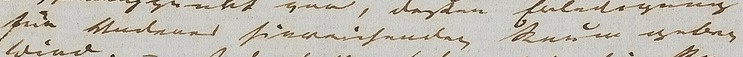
für Anderes hinreichenden Raum geben
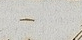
wird. –
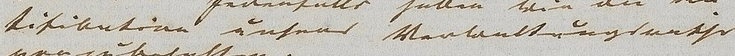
tifikation unsres Verwaltungsraths
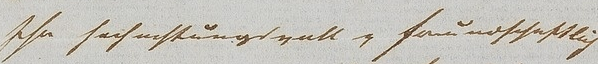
Ihr hochachtungsvoll & freundschaftlich
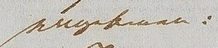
ergebener:
